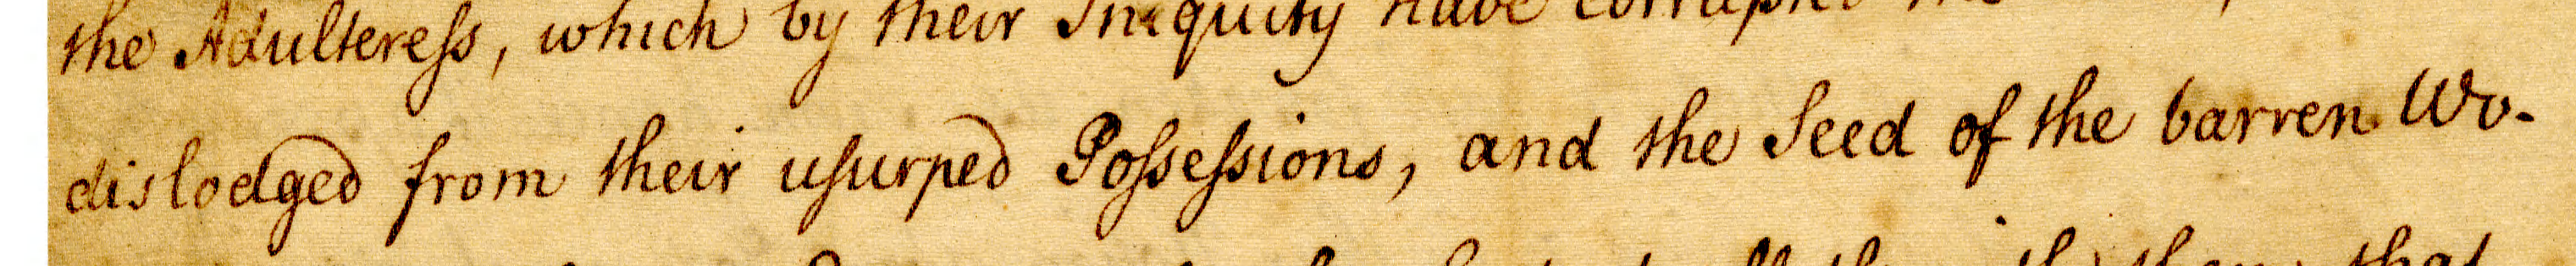dislodged from their usurped Possessions, and the seed of the barren Wo-
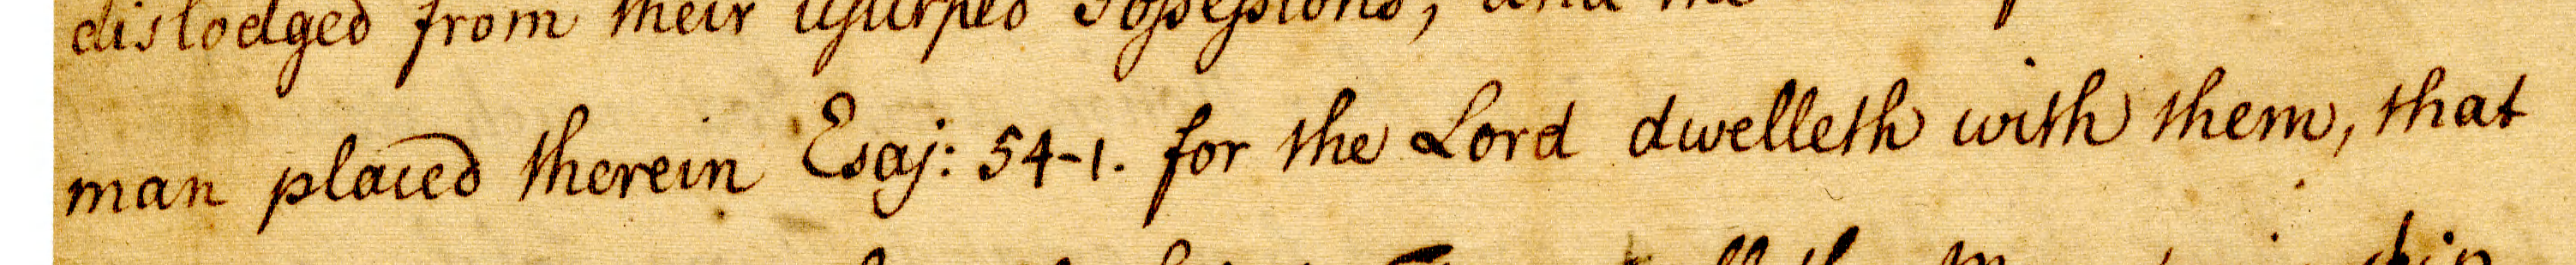man placed therein Esaj: 54-1. for the Lord dwelleth with them, that
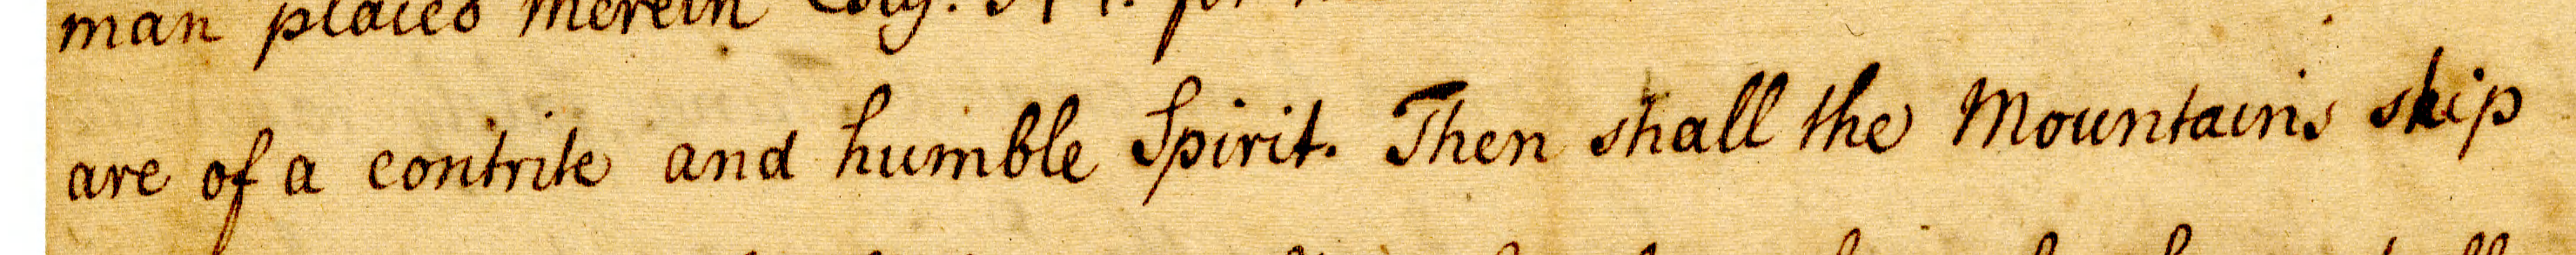are of a contrite and humble Spirit. Then shall the Mountains skip
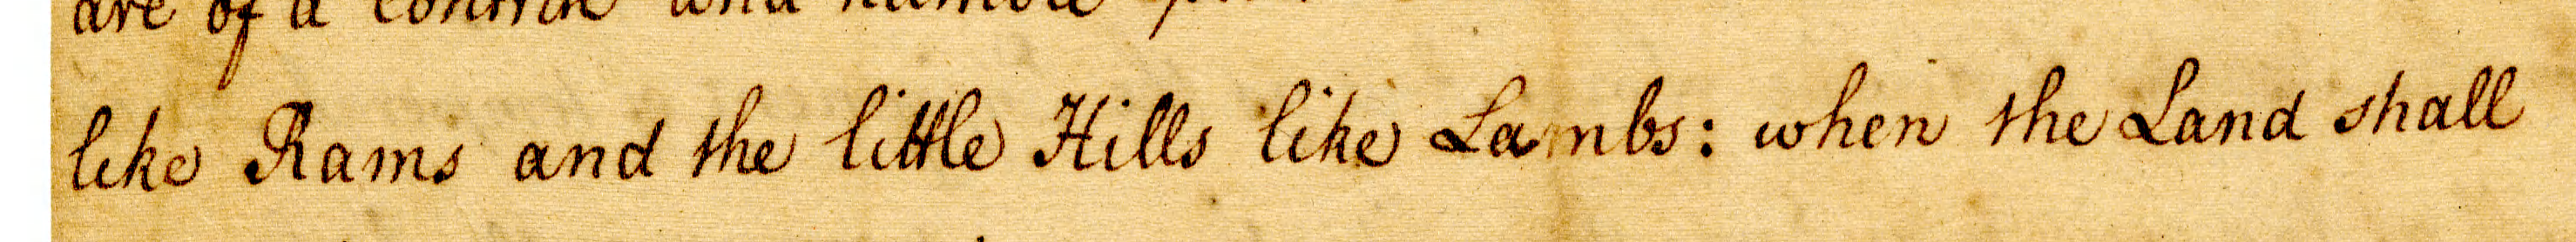like Rams and the little Hills like Lambs: when the Land shall
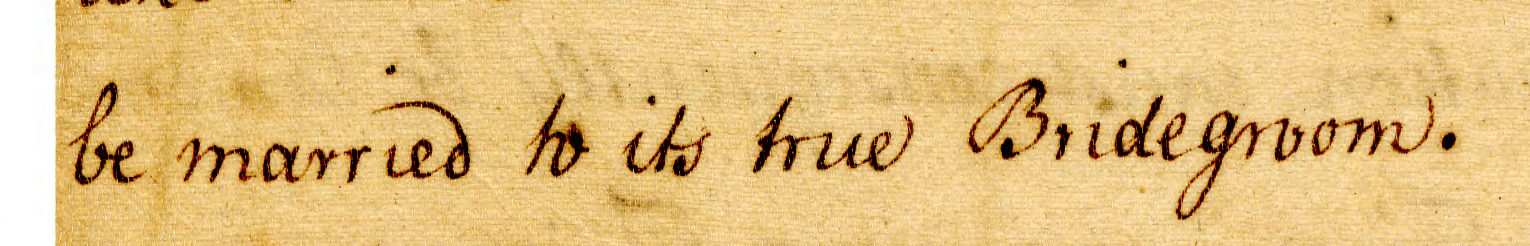be married to its true Bridegroom.
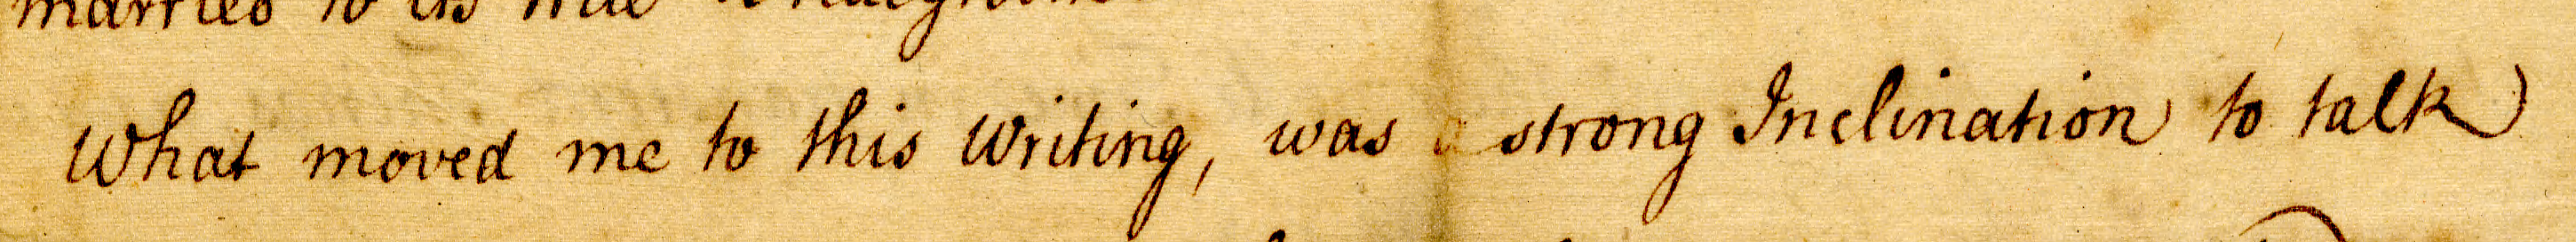What moved me to this writing, was a strong Inclination to talk
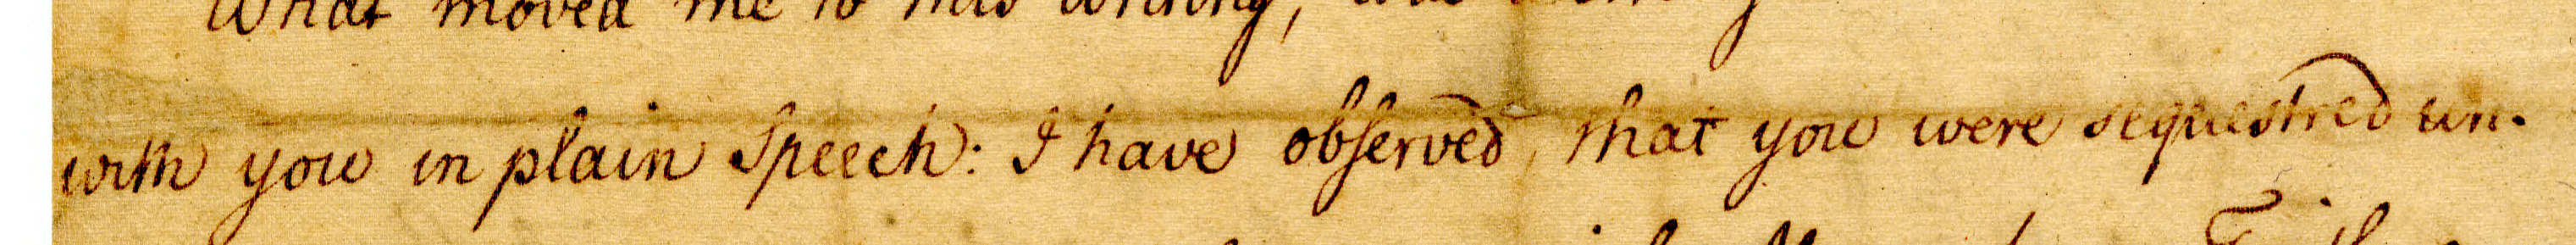with you in plain Speech: I have observed that you were sequestered un-
